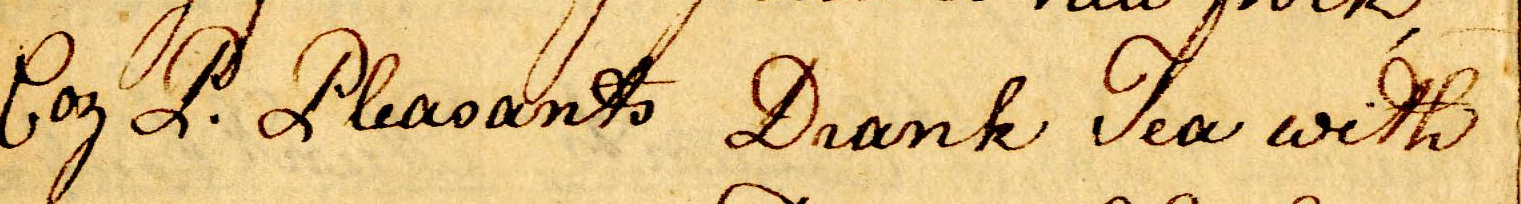Coz P. Pleasants Drank Tea with
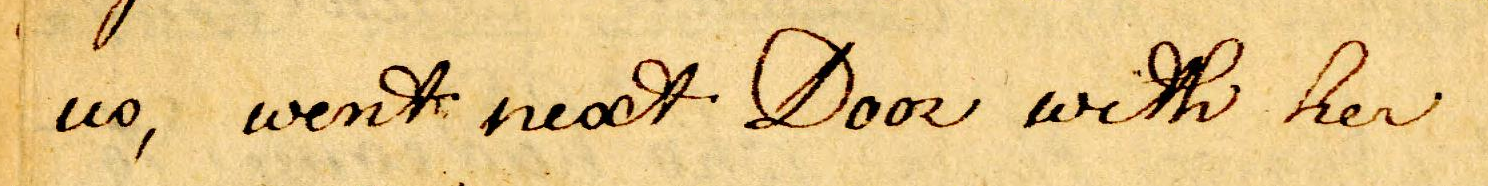us, went next Door with her
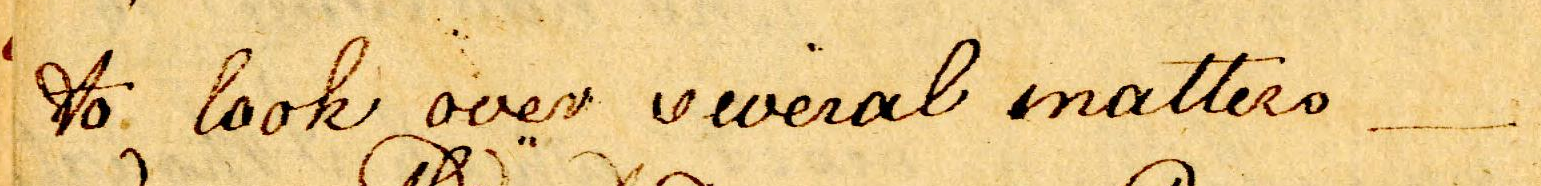to look over several matters
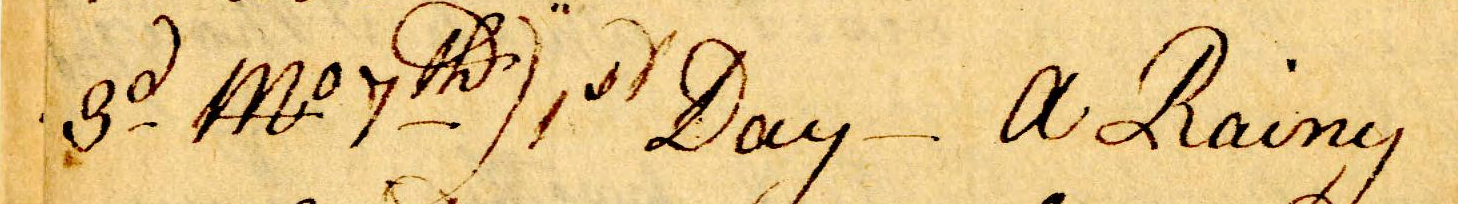3^d M^o 7^th) 1^st Day- A Rainy
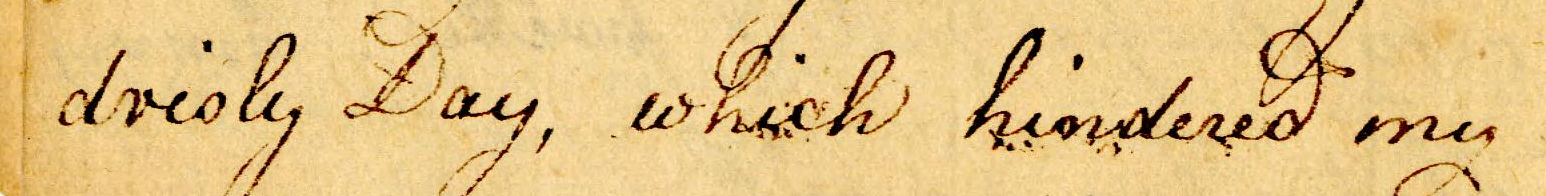drisly day, which hindered my
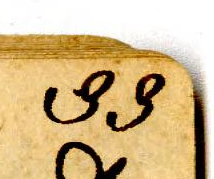33
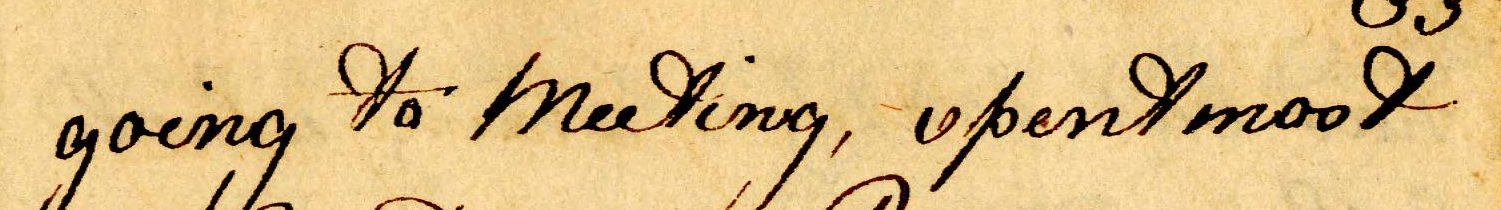going to Meeting, spent most
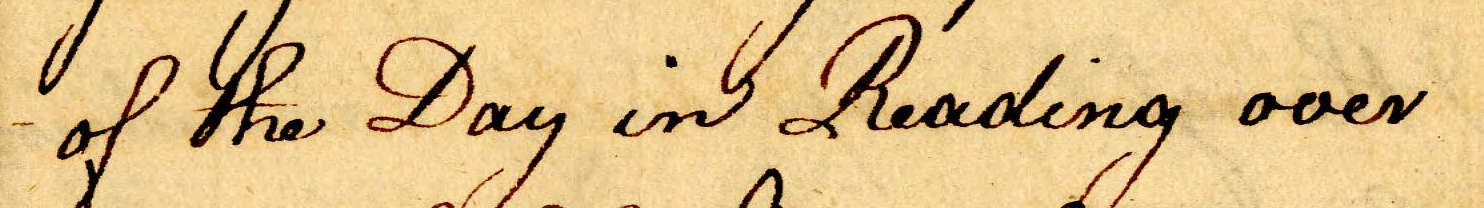of the Day in Reading over
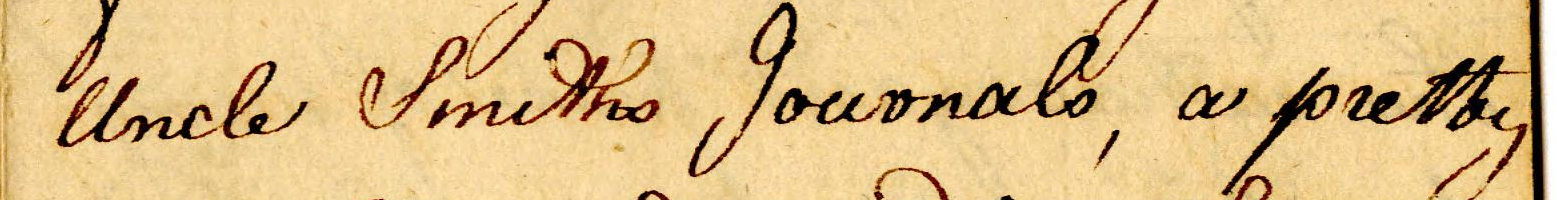Uncle Smiths Journals, a pretty
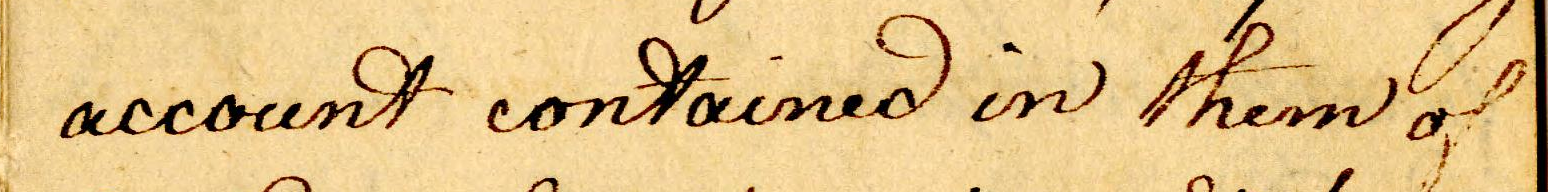account contained in them of
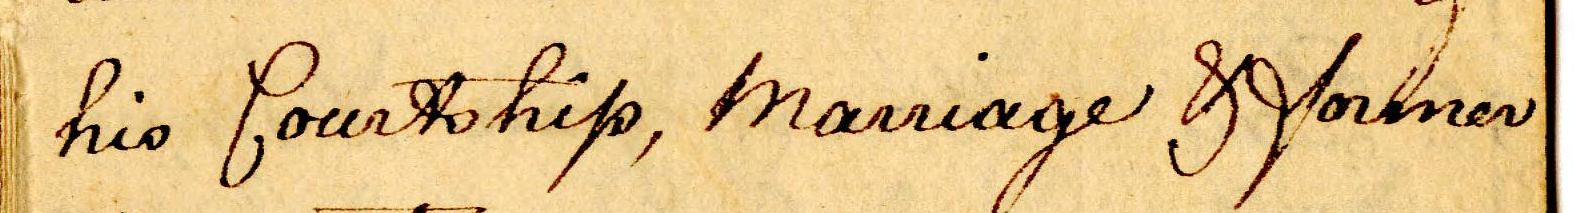his Courtship, Marriage & former
